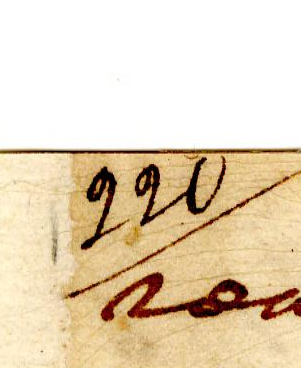220
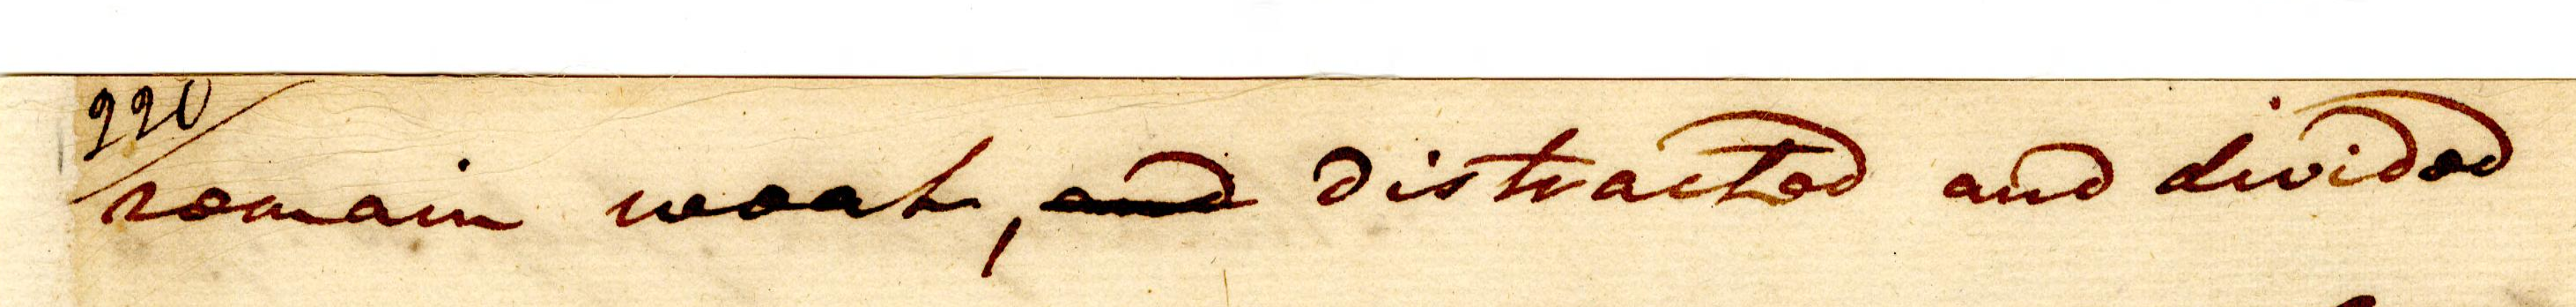remain weak, [and] distracted and divided
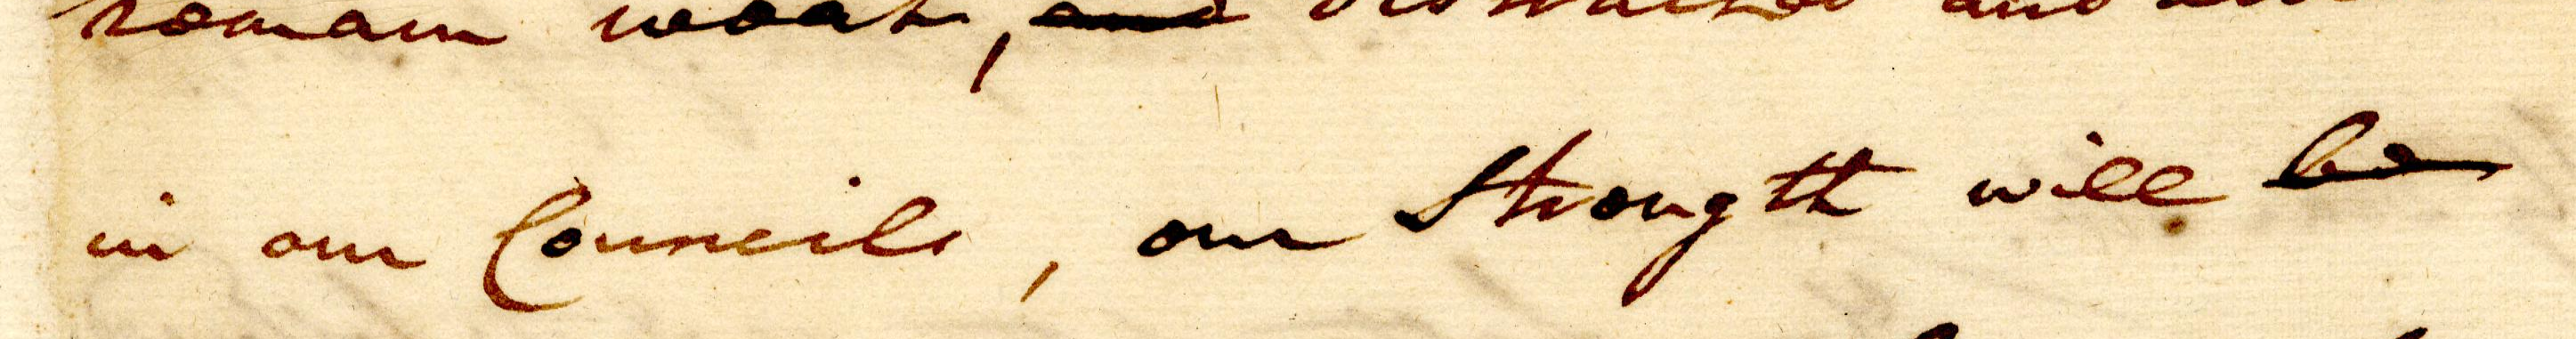in our Councils, our strength will [be]
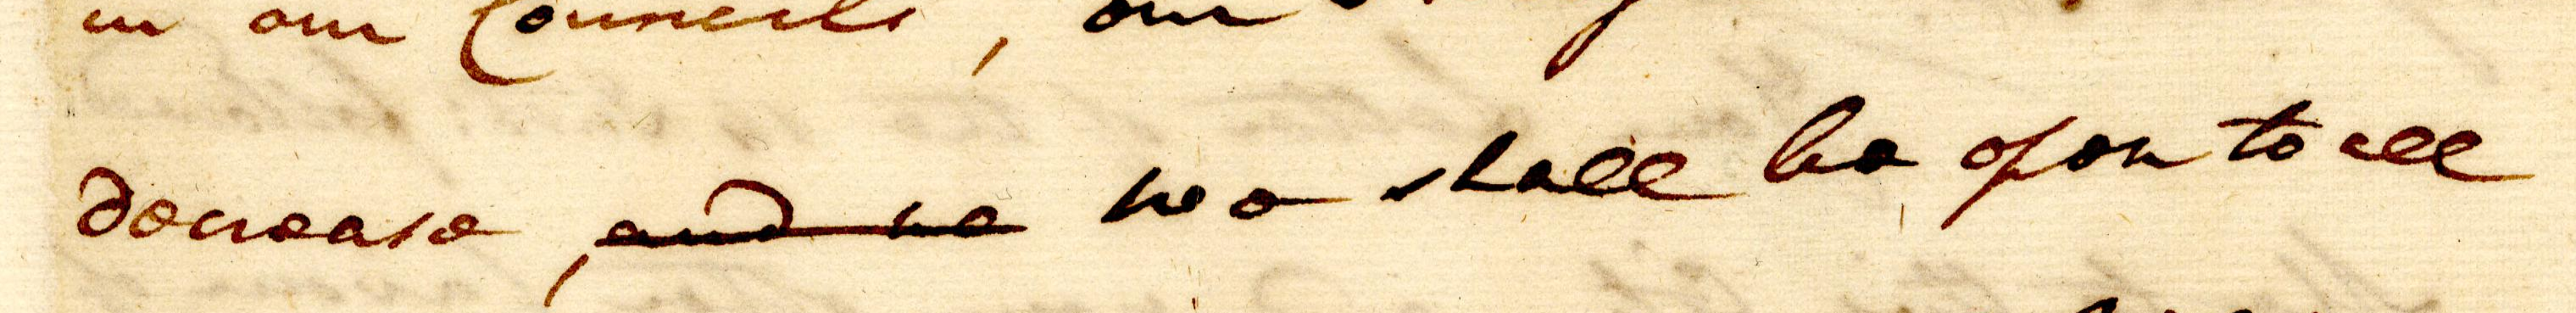decrcase, [and we] we shall be open to all
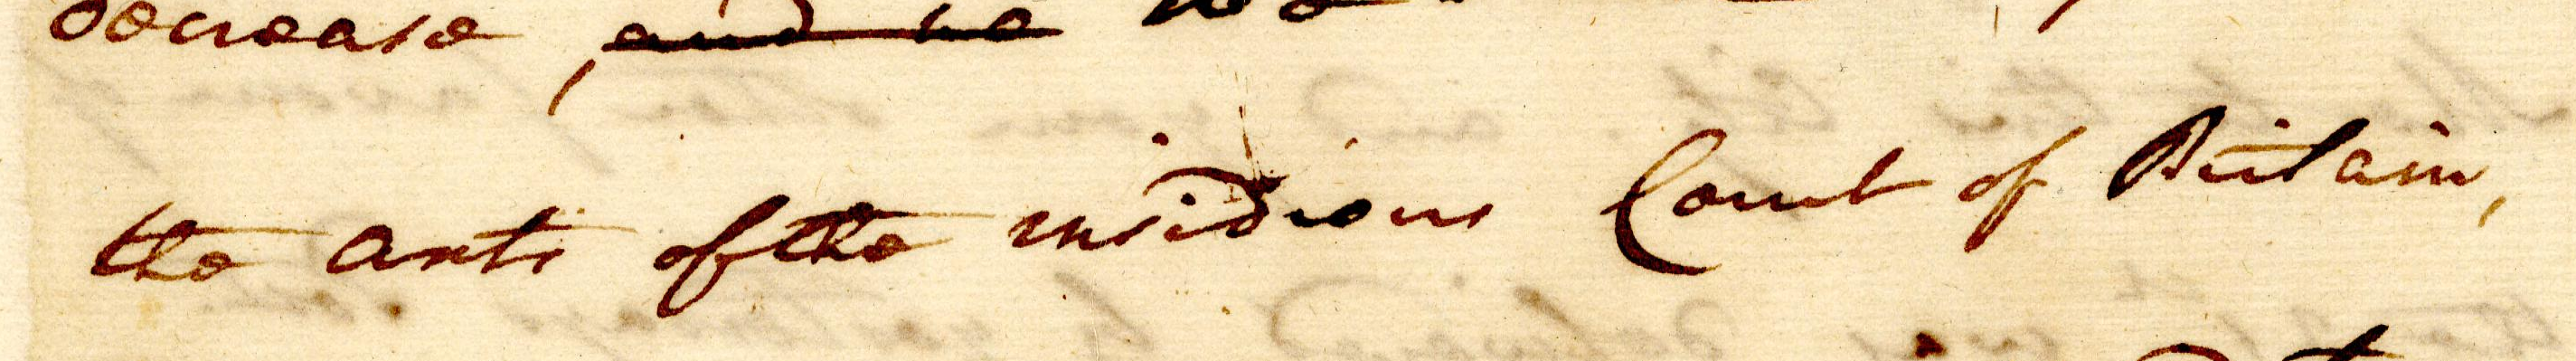the arts of the insidious Court of Britain
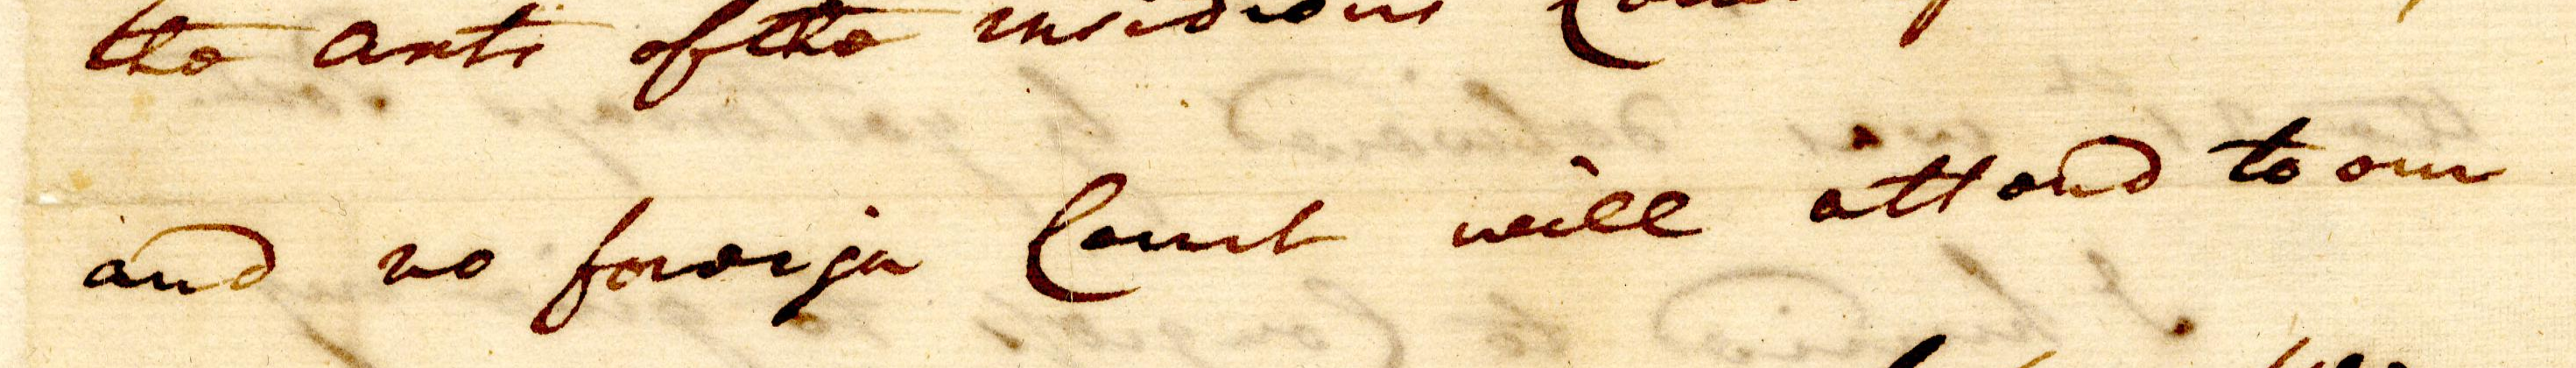and no foreign Court will attend to our
